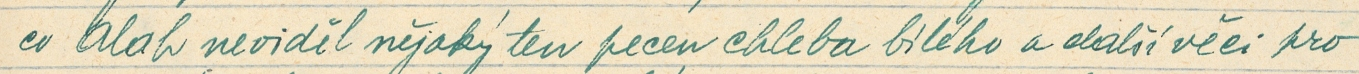co Alah neviděl nějaký ten pecen chleba bílého a další věci pro
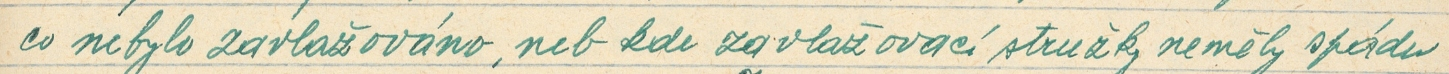co nebylo zavlažováno, neb kde zavlažovací stružky neměly spádu
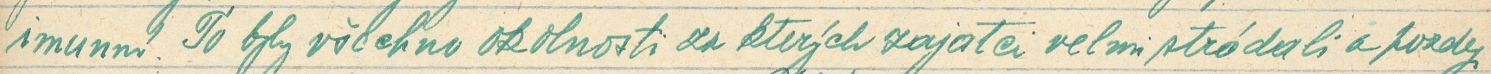imunní. To byly všechno okolnosti za kterých zajatci velmi strádali a pozdej
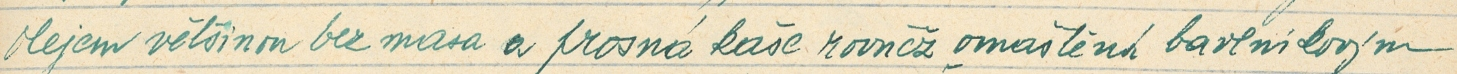olejem většinou bez masa a prosná kaše rovněž omaštěná bavlníkovým
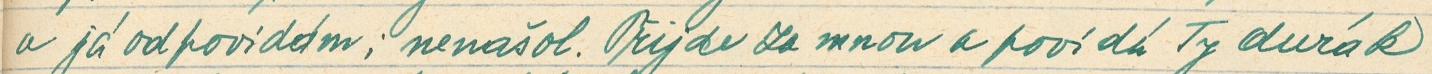a já odpovídám: nenašol. Přijde za mnou a povídá Ty durák.
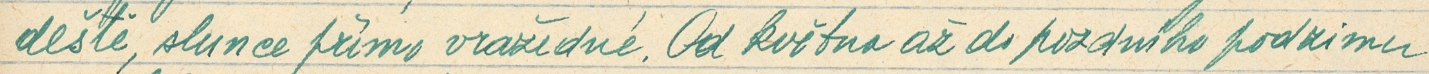deště, slunce přímo vražedné. Od května až do pozdního podzimu
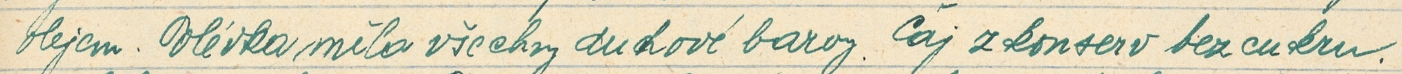olejem. Polévka měla všechny duhové barvy. Čaj z konserv bez cukru.
